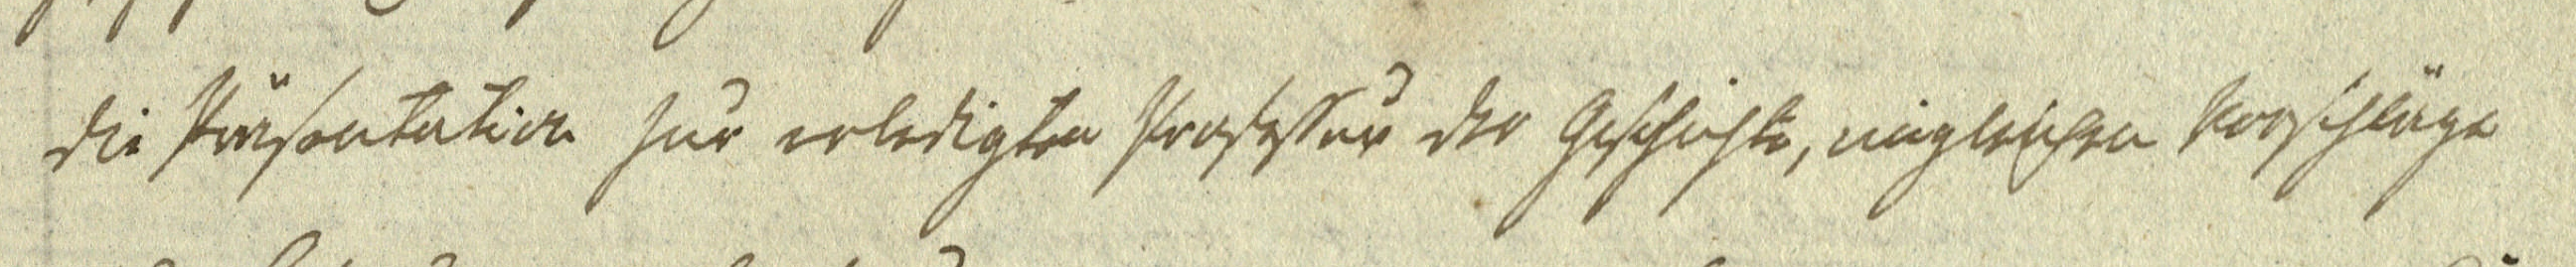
die Präsentation zur erledigten Professur der Geschichte, imgleichen Vorschläge
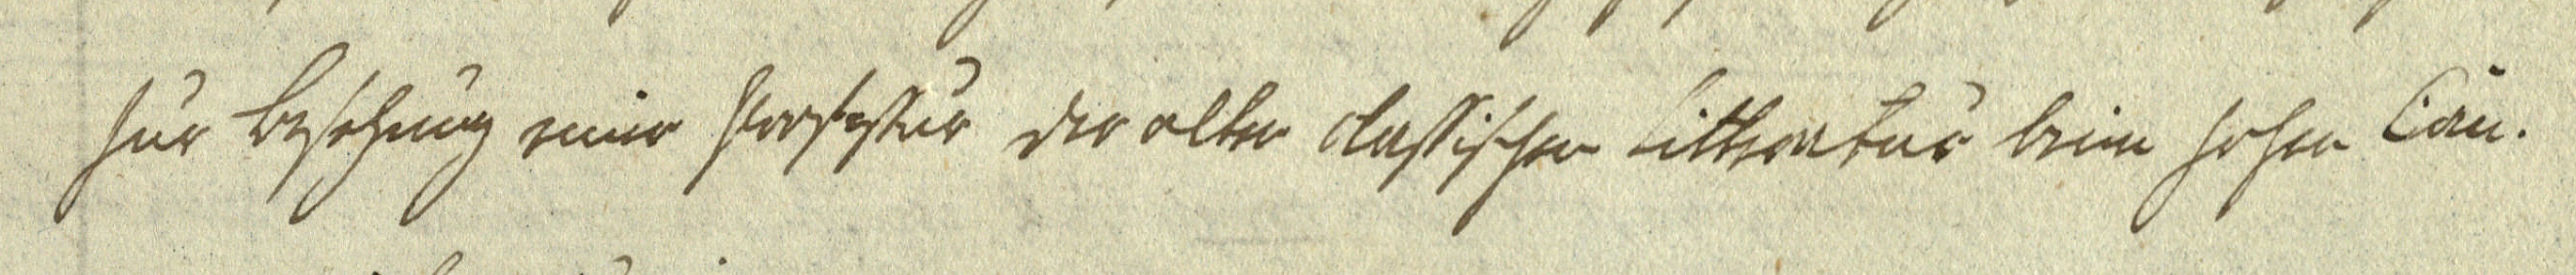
zur Besetzung einer Professur der alten classischen Litteratur beim Hohen Can¬
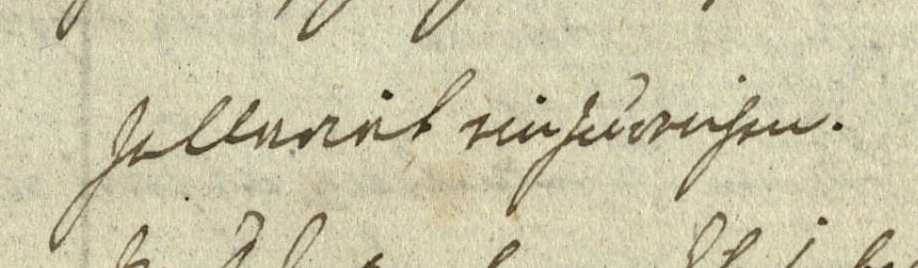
zellariat einzureichen.
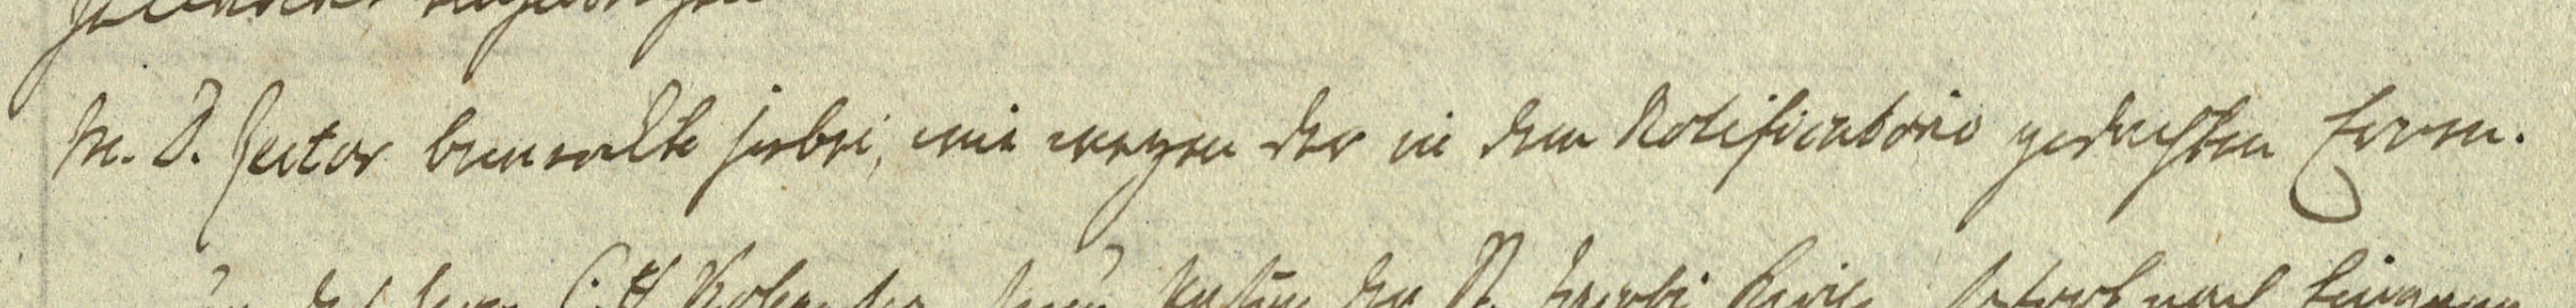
M. D. Rector bemerkte hiebei, wie wegen der in dem Notificatorio gedachten Ernen¬
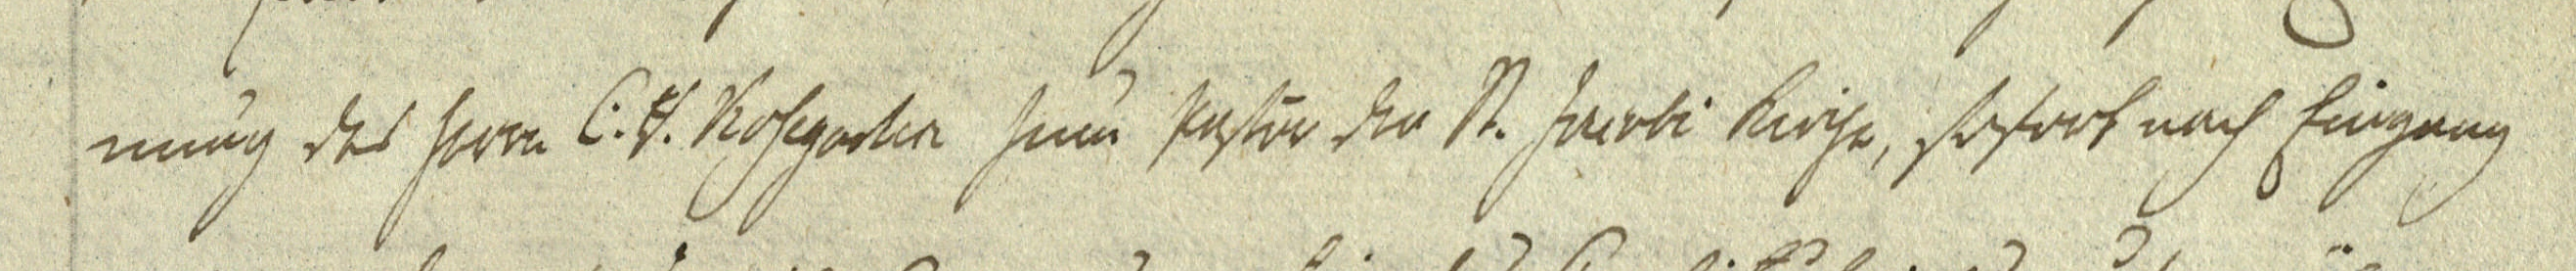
nung des Herrn C. R. Kosegarten zum Pastor der St. Jacobi Kirche, sofort nach Eingang
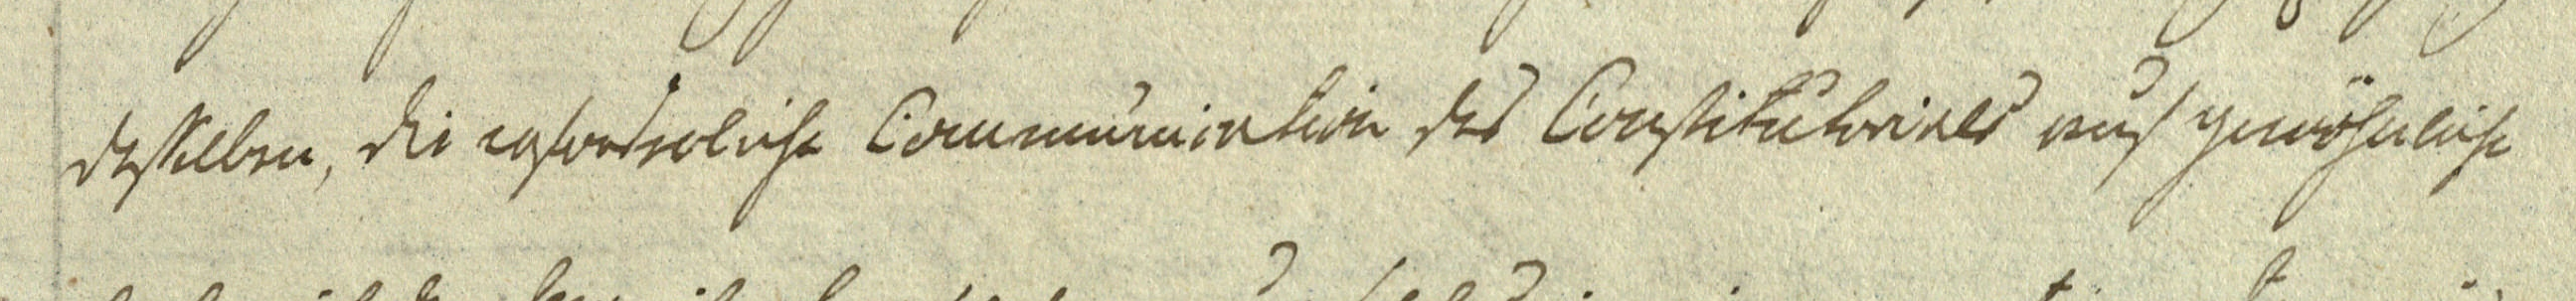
desselben, die erforderliche Communication des Constitutorials auf gewöhnliche
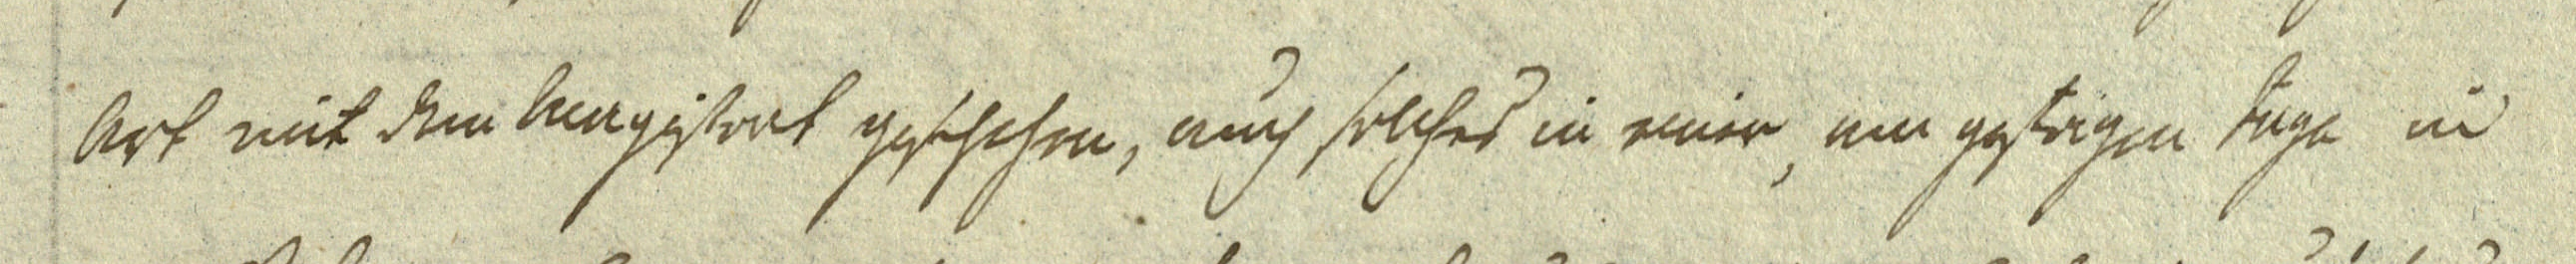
Art mit dem Magistrat geschehen, auch solches in einer am gestrigen Tage in
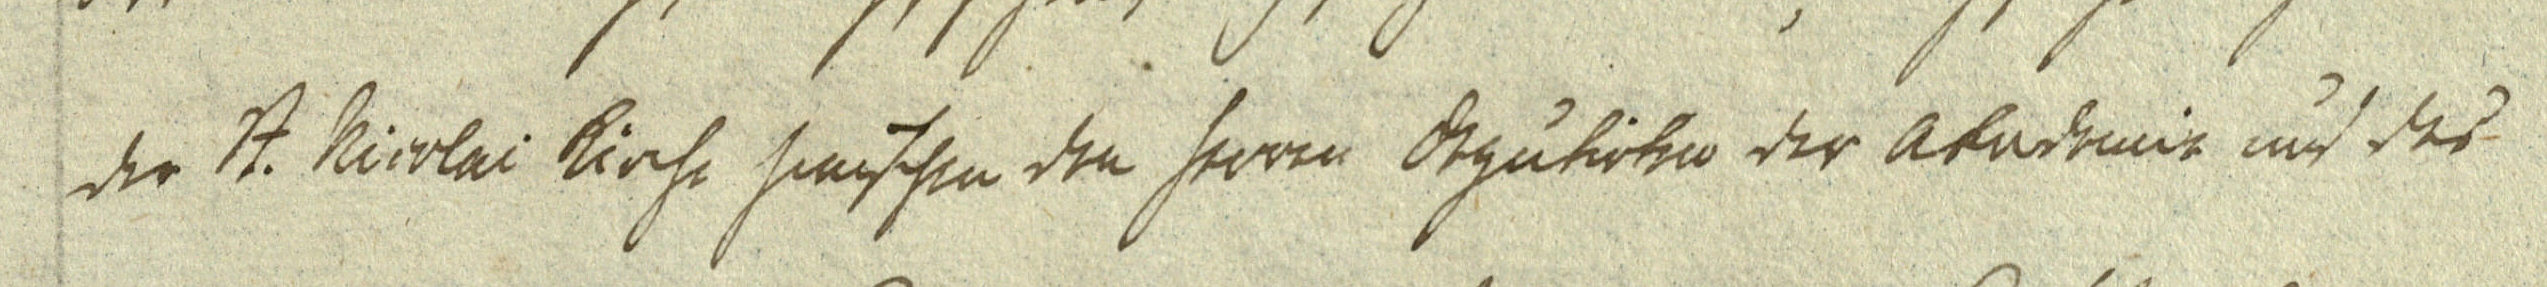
der St. Nicolai Kirche zwischen den Herrn Deputirten der Akademie und des
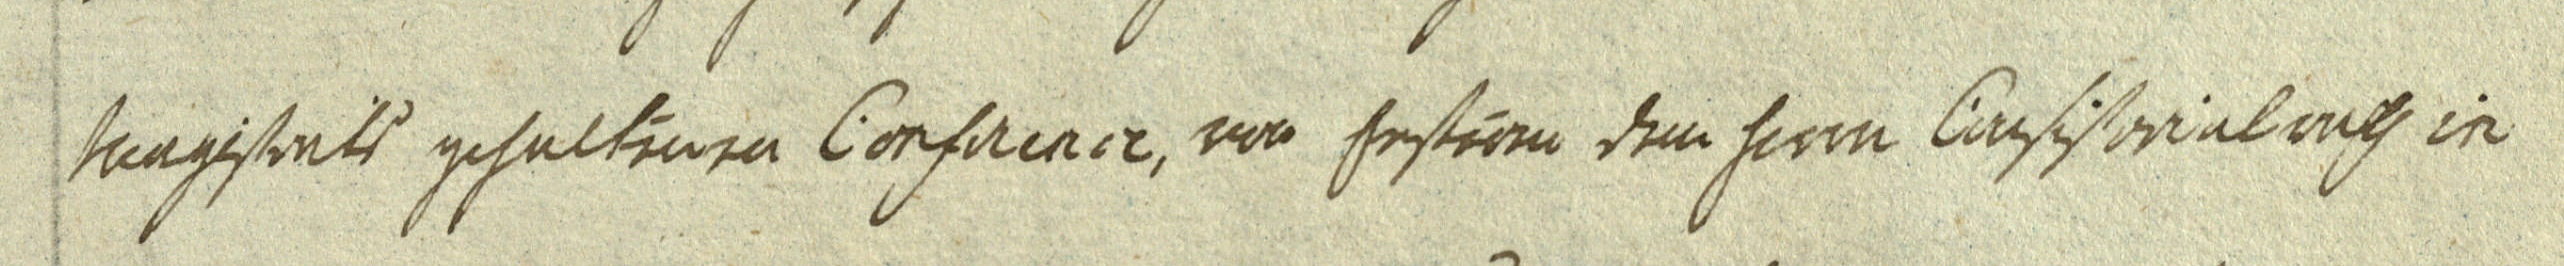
Magistrats gehaltenen Conference, von Ersterm dem Herrn Consistorialrath in
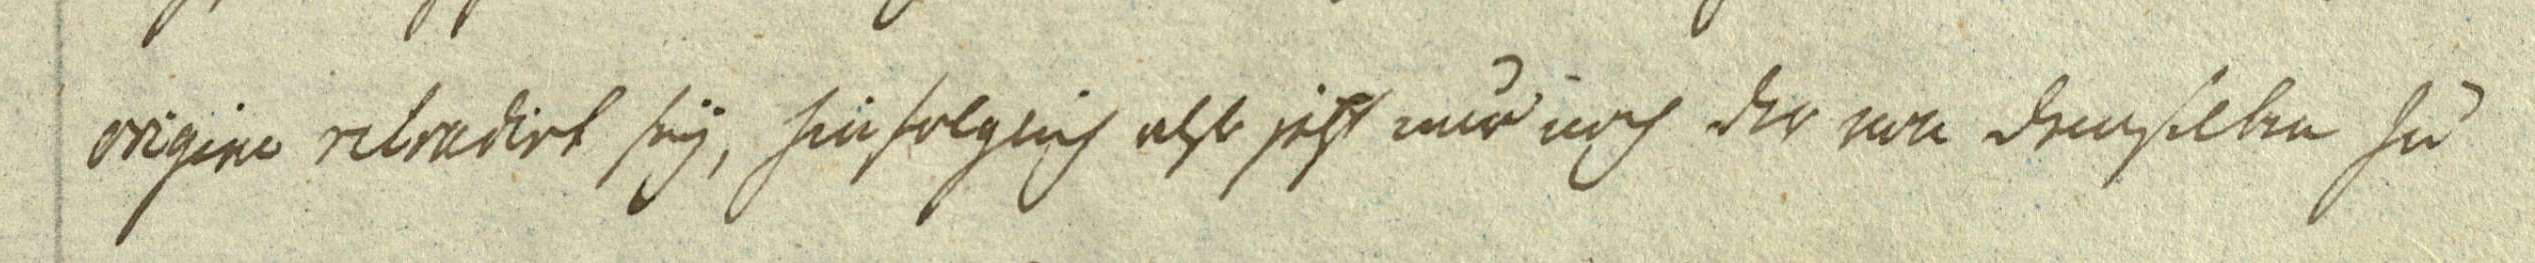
origine retradirt seÿ, hinfolglich also jetzt nur noch der von demselben zu
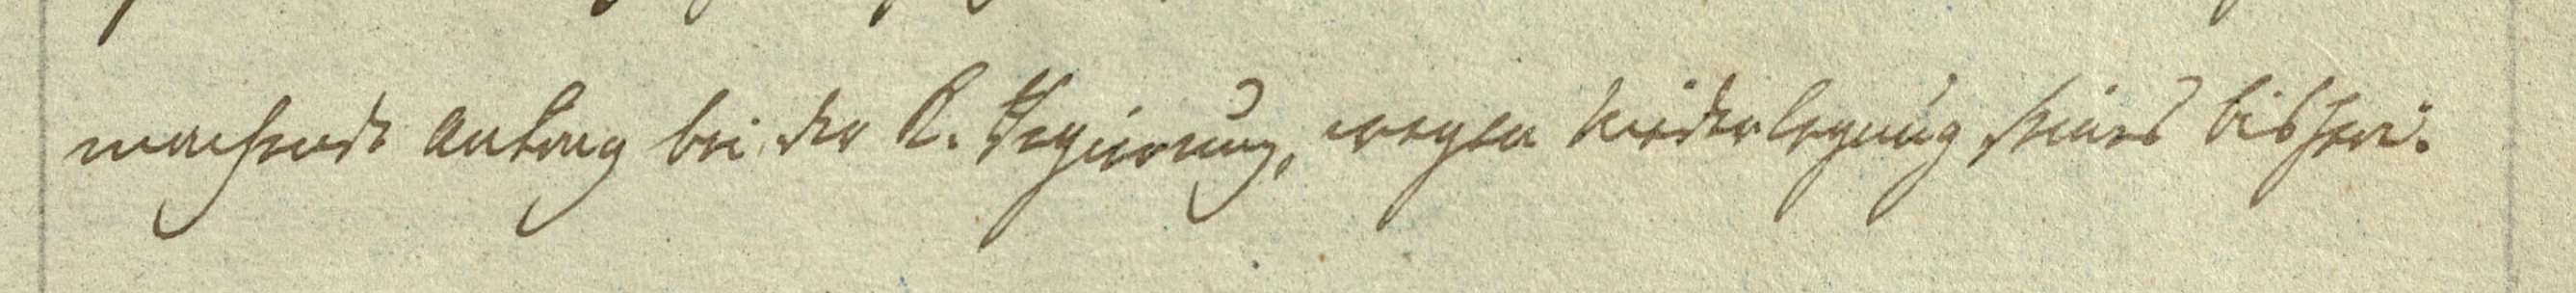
machende Antrag bei der K. Regierung, wegen Niederlegung seines bisheri¬
